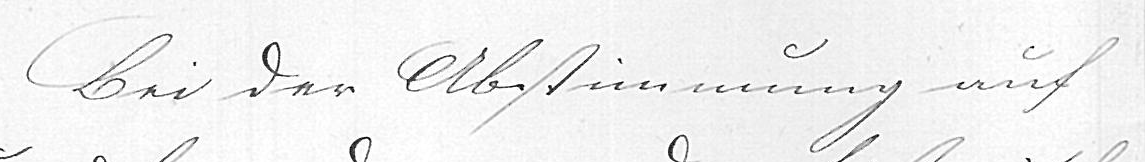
Bei der Abstimmung auf
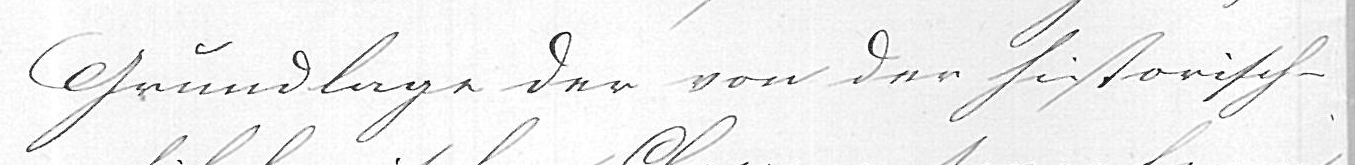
Grundlage der von der historisch-
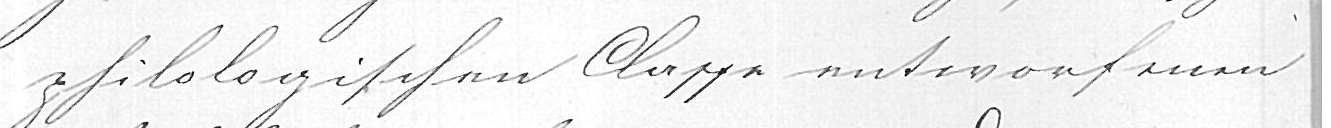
philologischen Classe entworfenen
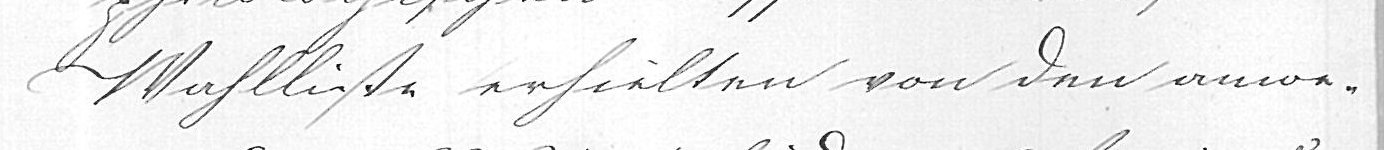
Wahlliste erhielten von den anwe-
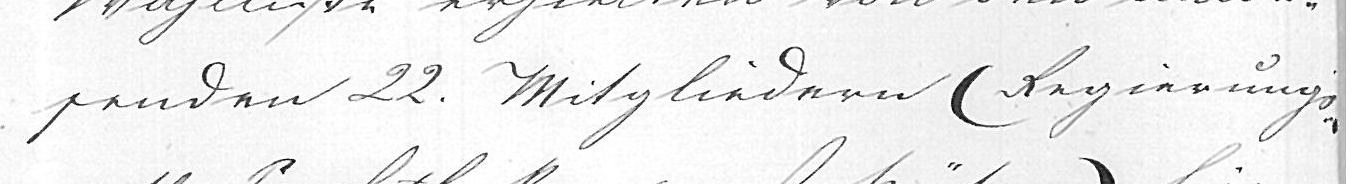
senden 22. Mitgliedern (Regierungs-
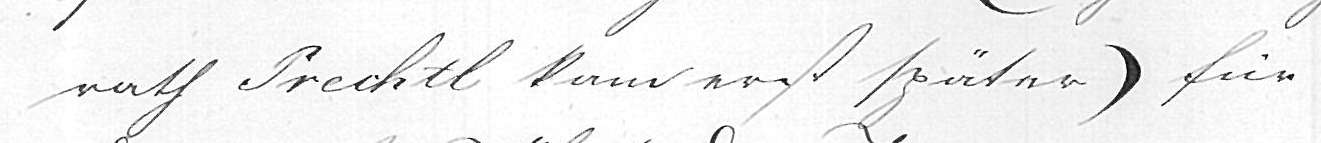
rath Prechtl kam erst später) für
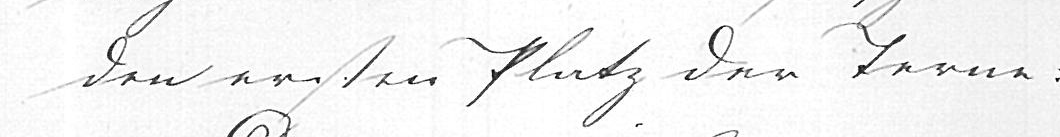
den ersten Platz der Terne:
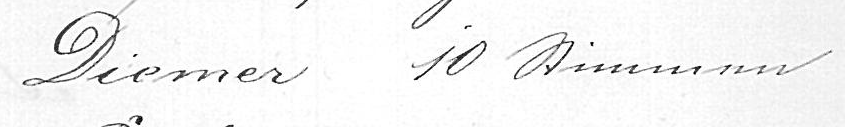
Diemer 10 Stimmen
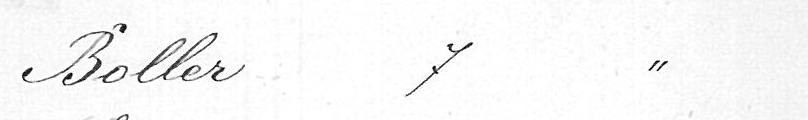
Boller 7 "
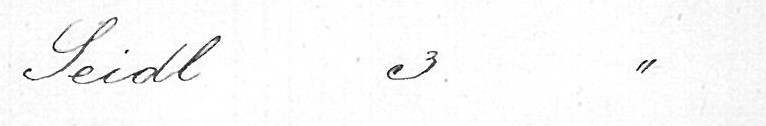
Seidl 3 "
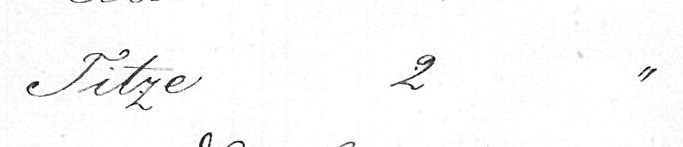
Sitze 2 "
